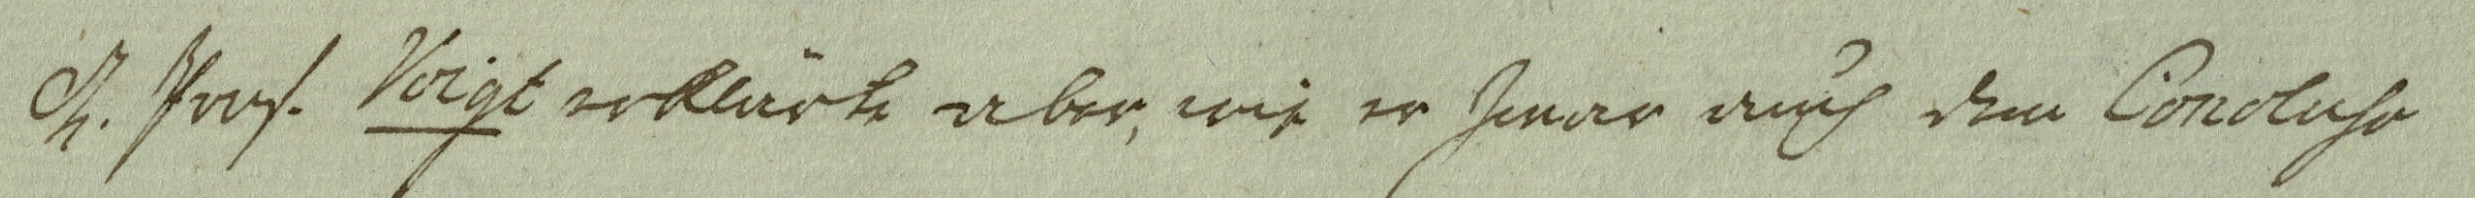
dh. Prof. Voigt erklärte aber, wie er zwar auch dem Concluso
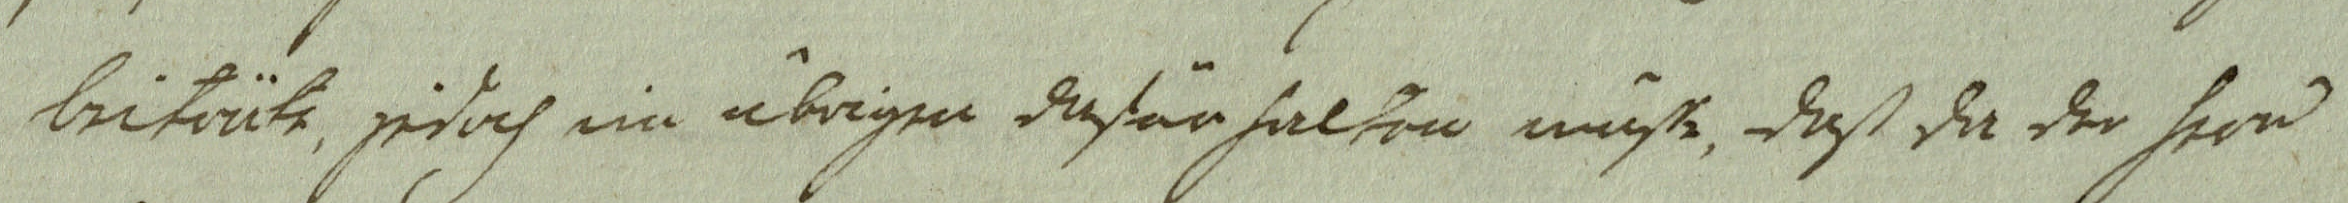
beiträte, jedoch im übrigen dafür halten müsse, daß da der Herr
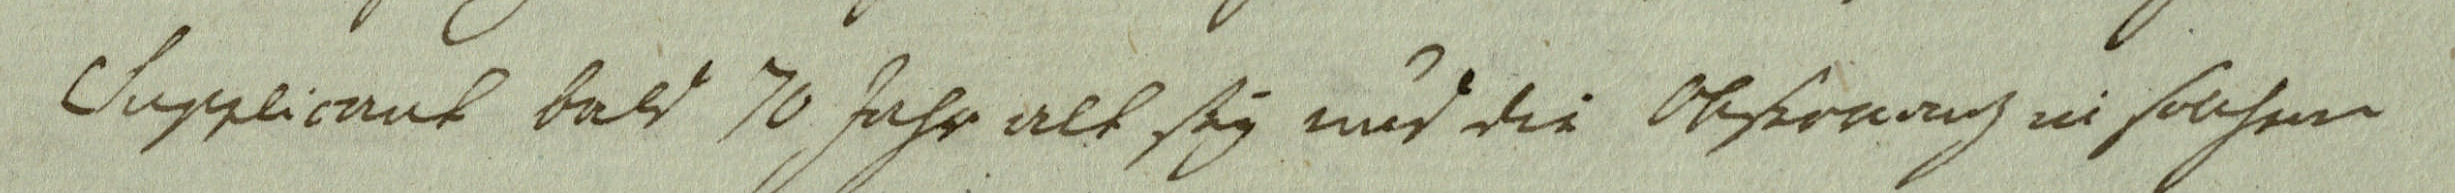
Supplicant bald 70 Jahr alt seÿ und die Observanz in solchem
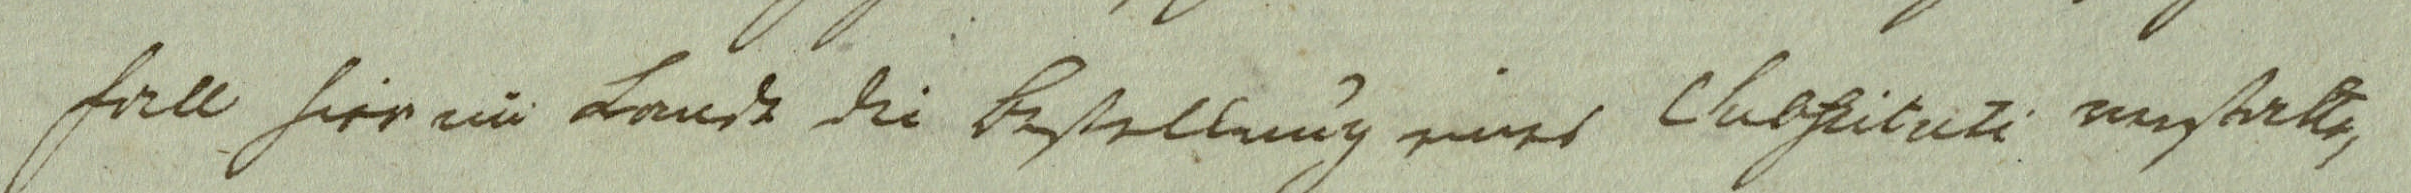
Fall hier im Lande die Bestellung eines Substituti verstatte,
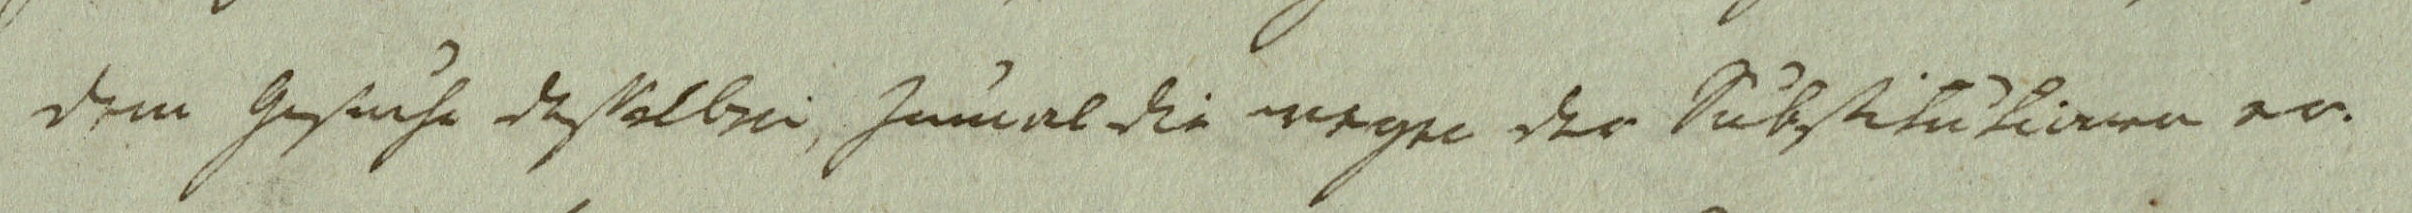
dem Gesuche desselben, zumal die wegen der Substitutionen er¬
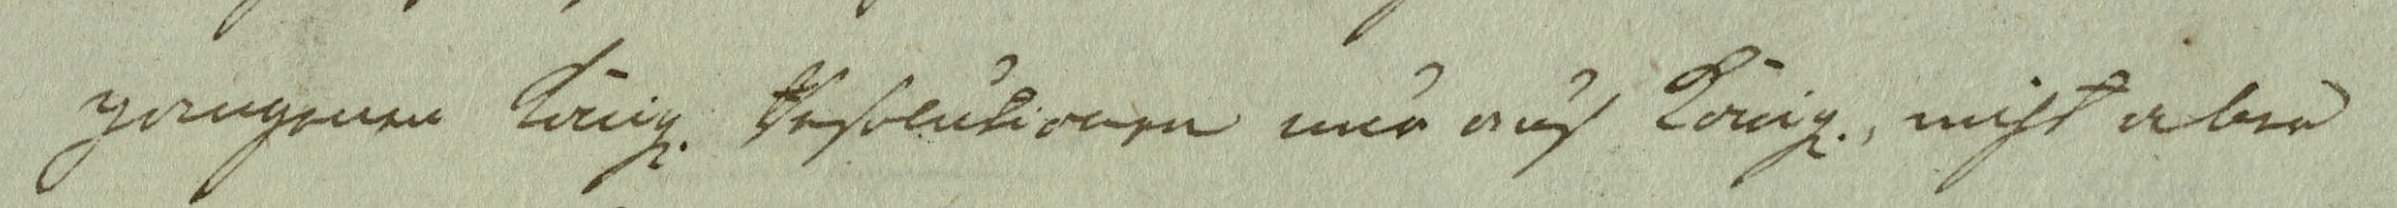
gangenen Königl. Resolutionen nur auf Königl., nicht aber
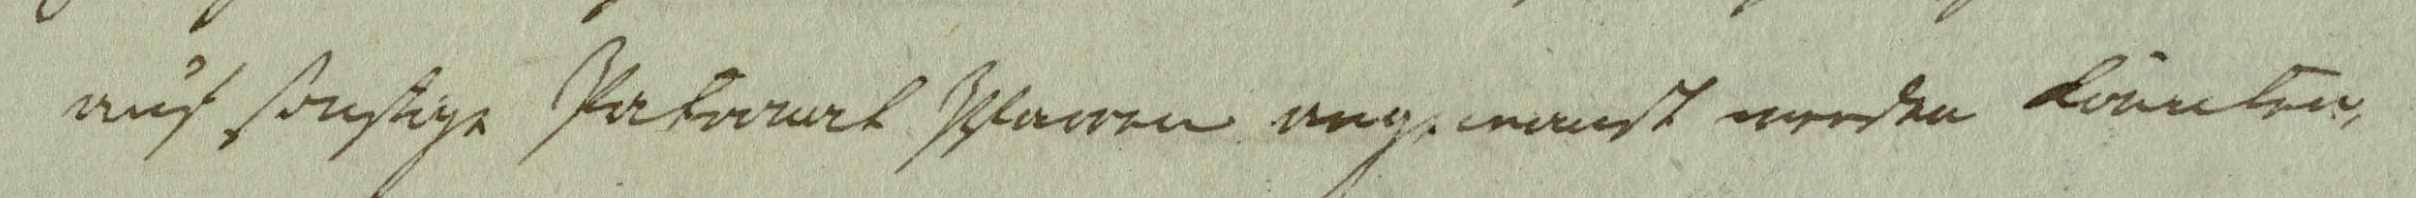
auf sonstige Patronat Pfarren angewandt werden könnten,
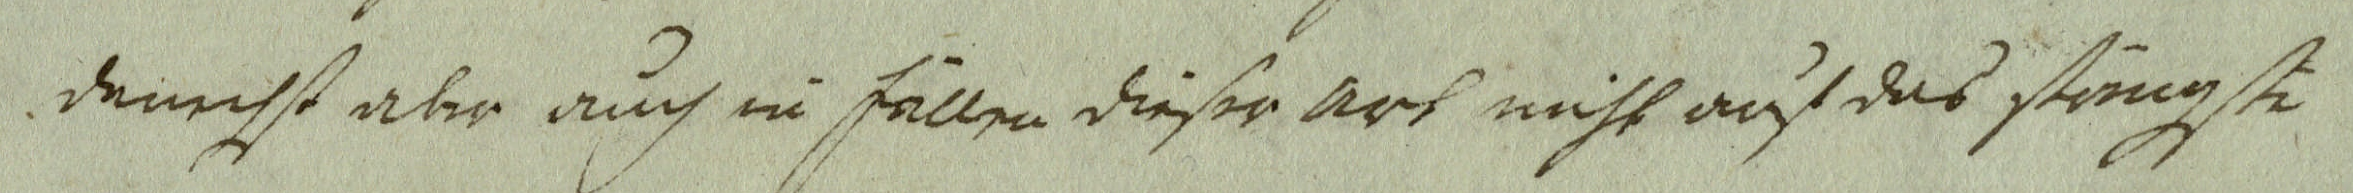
dannechst aber auch in Fällen dieser Art nicht auf das strengste
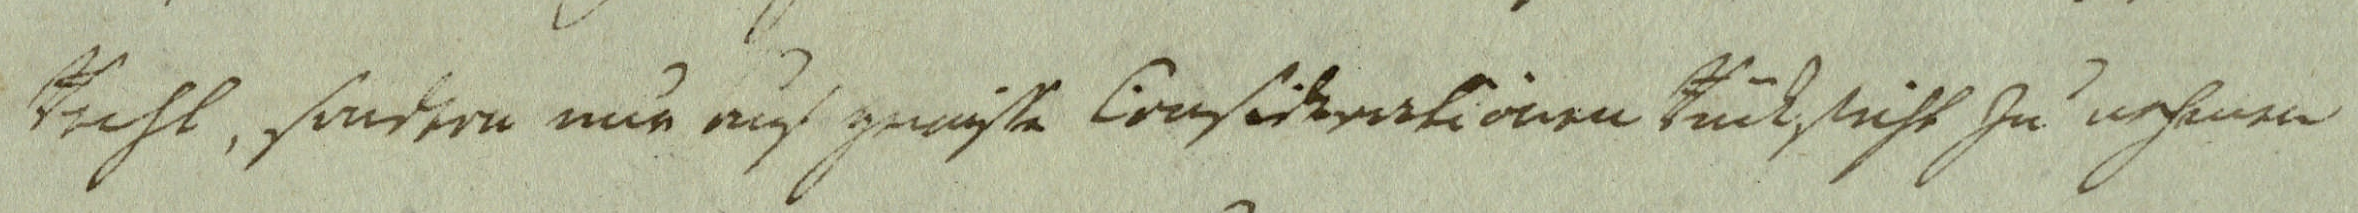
Recht, sondern nur auf gewisse Considerationen Rücksicht zu nehmen
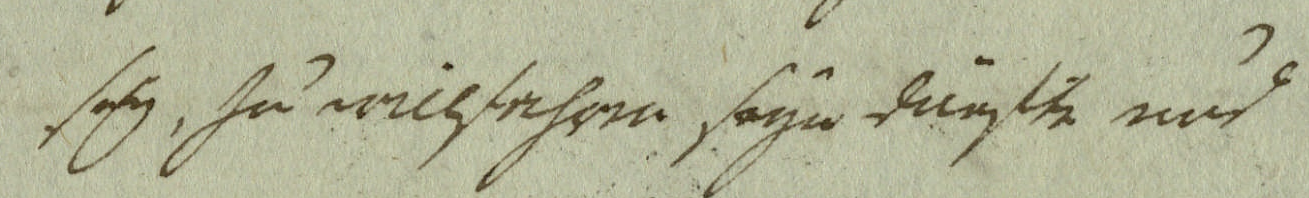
seÿ, zu willfahren seÿn dürfte und
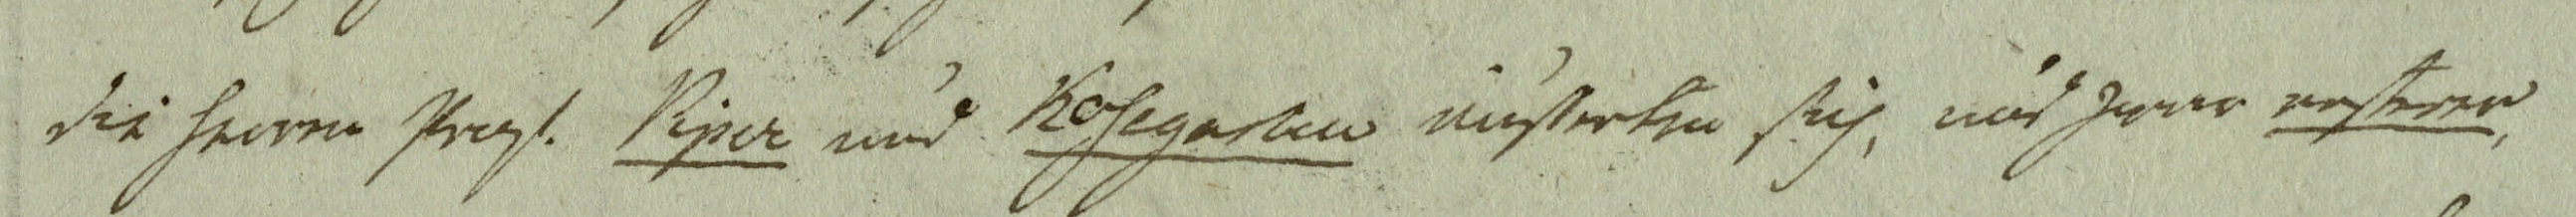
die Herren Piper und Kosegarten äusserten sich, und zwar ersterer
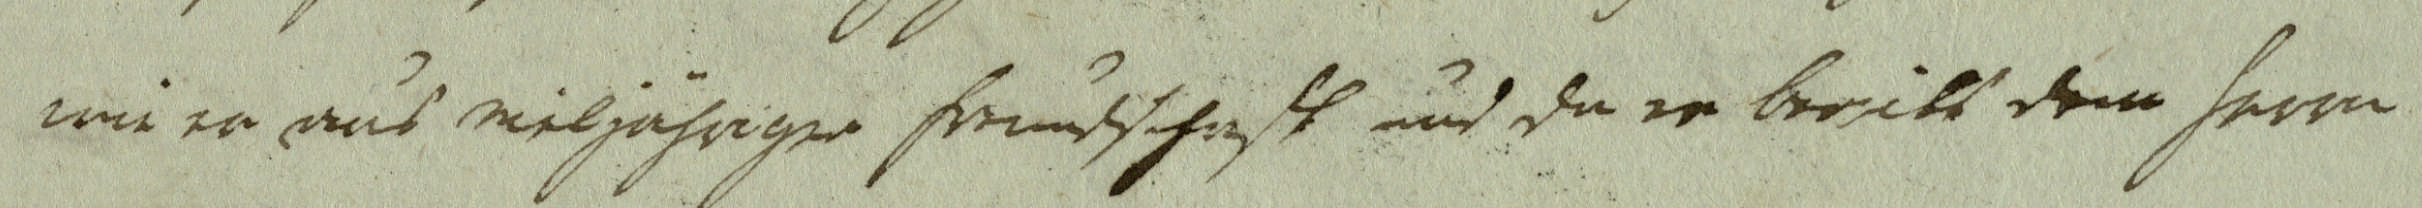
wie er aus vieljähriger Freundschaft und da er bereits dem Herrn
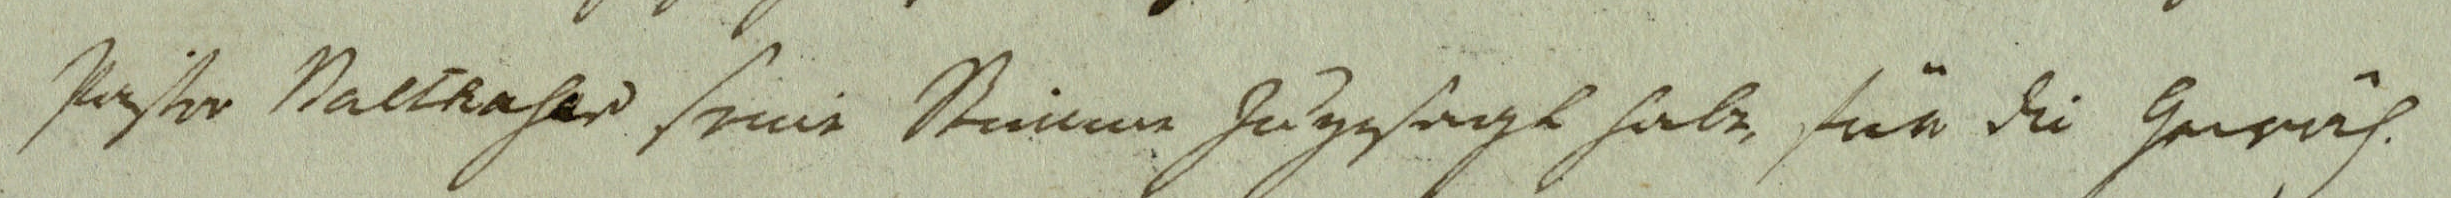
Pastor Balthasar seine Stimme zugesagt habe, für die Gewäh¬
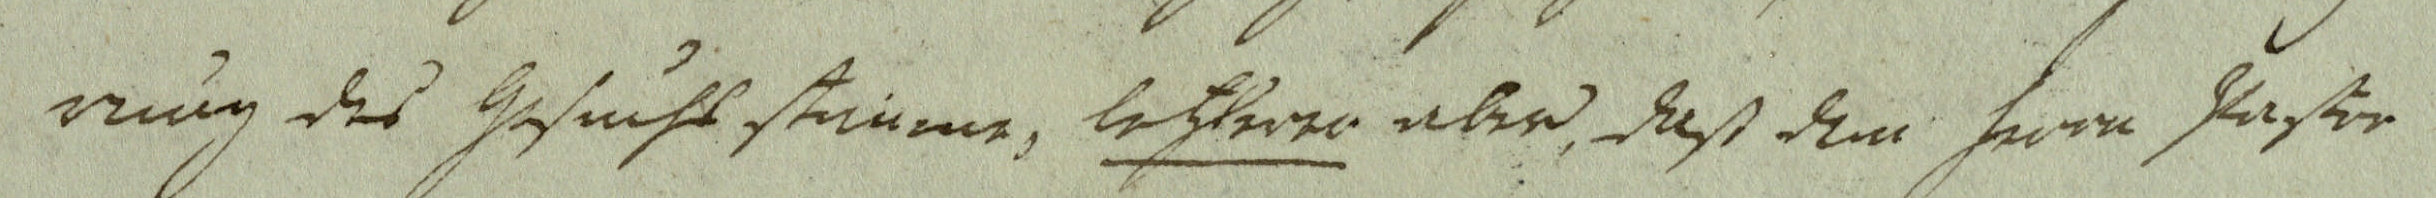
rung des Gesuchs stimme, letzterer aber, daß dem Herrn Pastor
